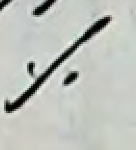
./.
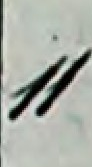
11
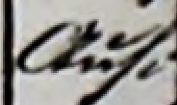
Aus„
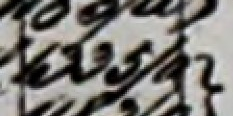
1335/a
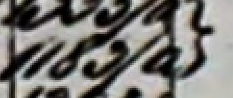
1183/a
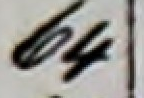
64
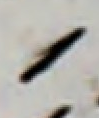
1
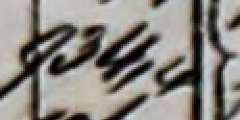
934,4
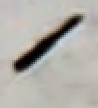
1
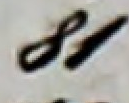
81
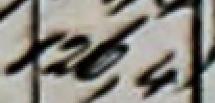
126,4
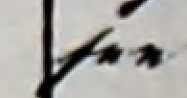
see
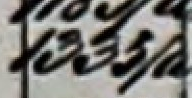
1335/a
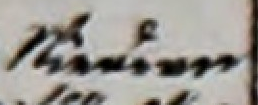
Niedern
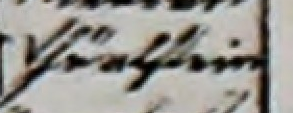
?hörlstein
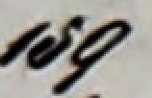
159
